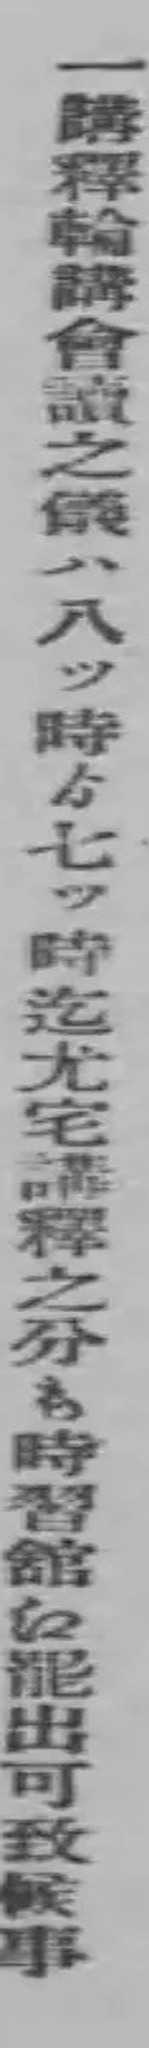一講釈輪講会読之儀ハ八ツ時ゟ七ツ時迄尤宅講釈之分も時習館え罷出可致候事
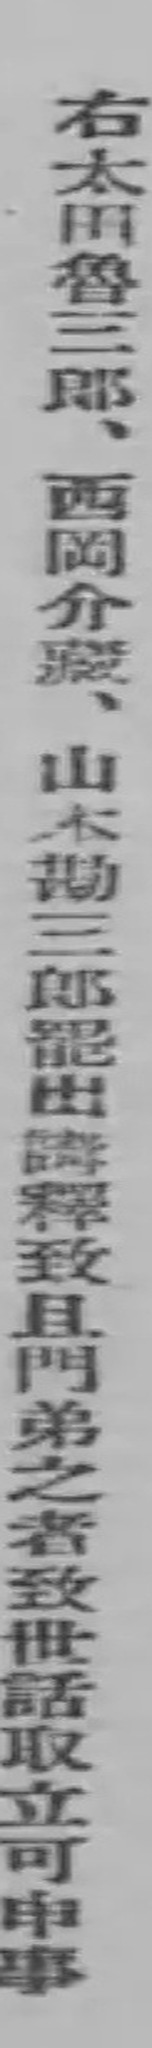右太田魯三郎、西岡介蔵、山本勘三郎罷出講釈致且門弟之者致世話取立可申事
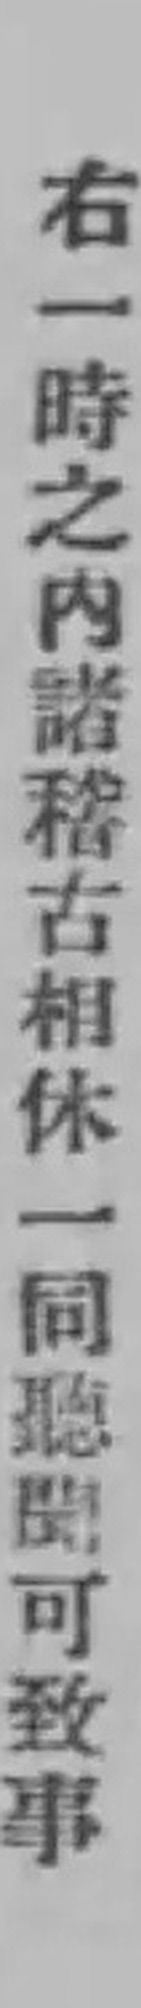右一時之内諸稽古古相休一同聴聞可致事
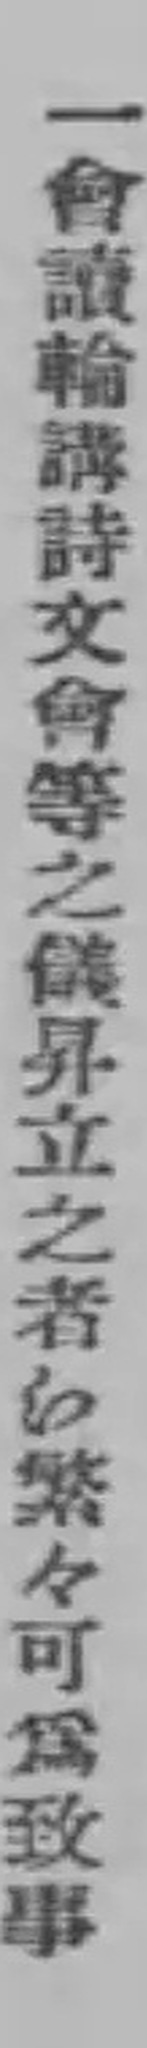一会読輪講詩文会等之儀昇立之者え繁々可為致事
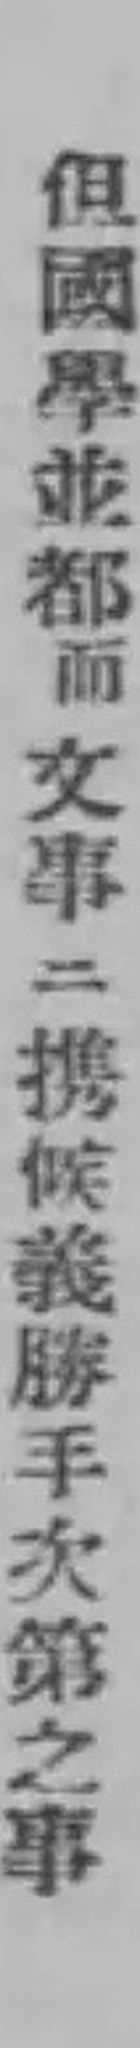但国学並都而文事ニ携候義勝手次第之事
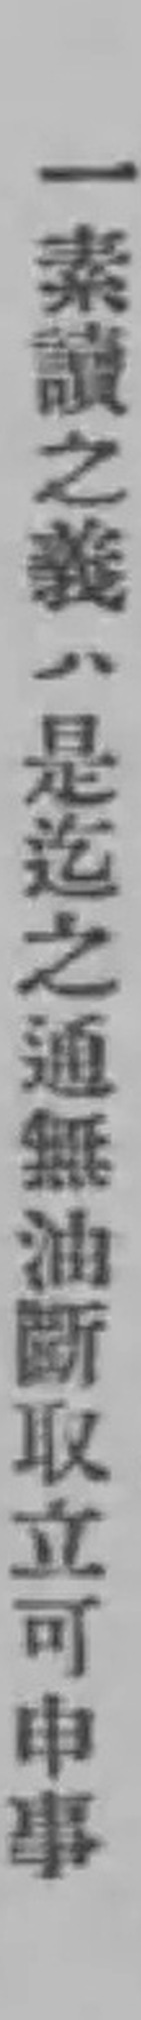一素読之義ハ是迄之通無油断取立可申事
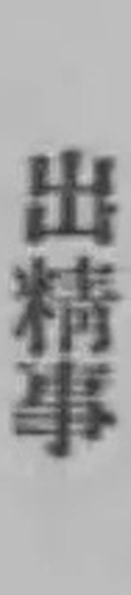出精事
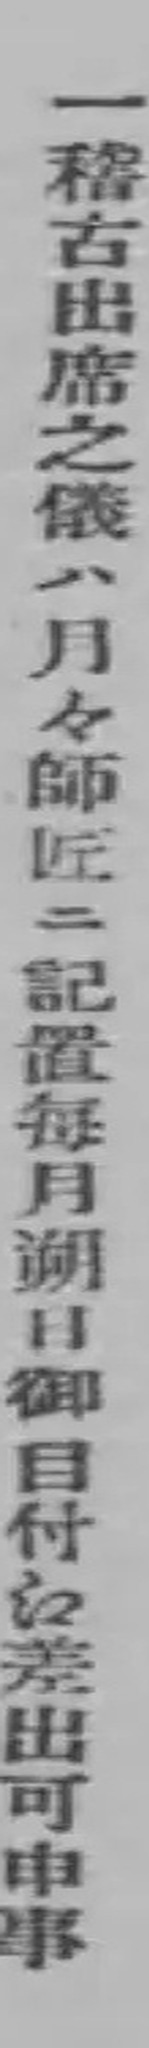一稽古出席之儀ハ月々師匠ニ記置毎月朔日目付え差出可申事
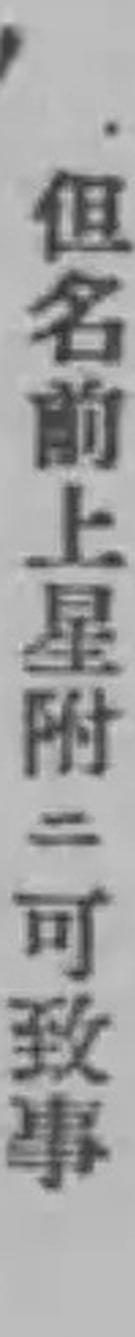但名前上星附ニ可致事
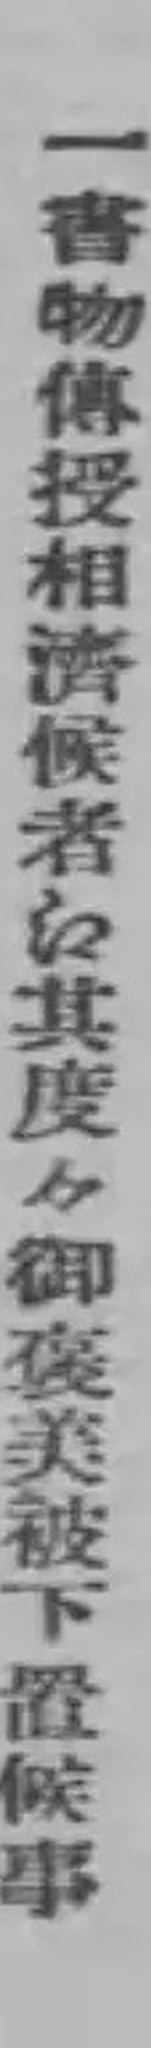一書物伝授相済候者え其度々御褒美被下置候事
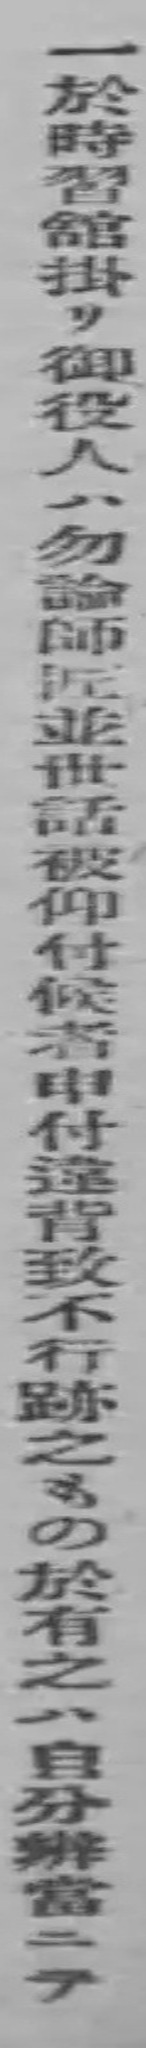一於時習館掛リ御役人ハ勿論師匠並世話役被仰付候者申付違背致不行跡之もの於有之ハ自分弁当ニテ
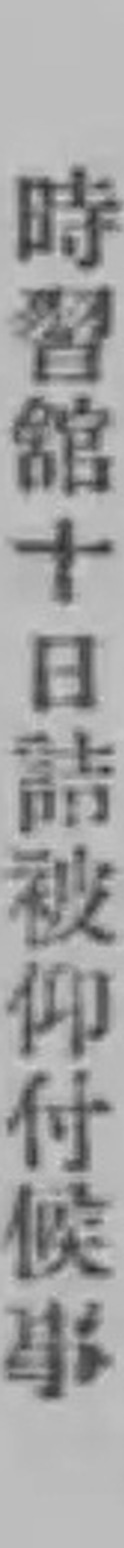時習館十日詰被仰付候事
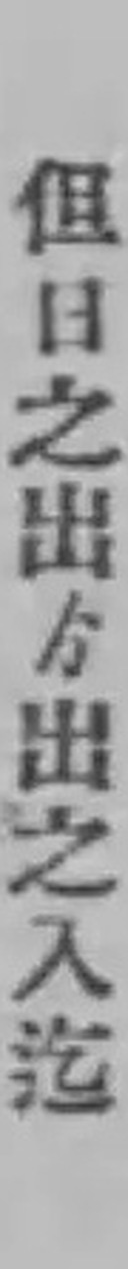但日之出ゟ出之入迄
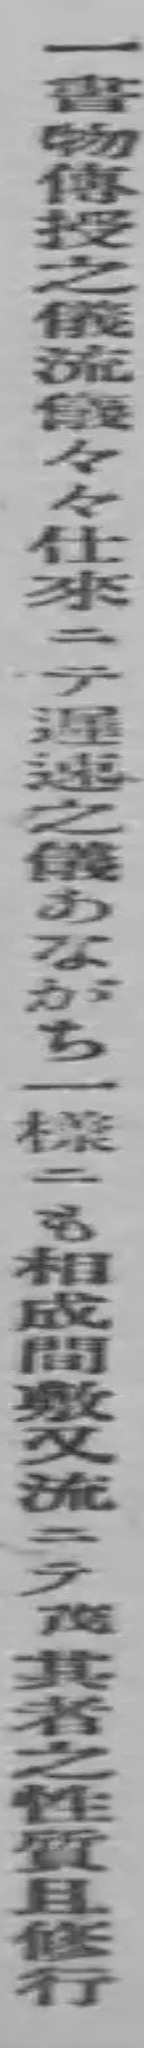一書物伝授之儀流儀々々仕来ニテ遅速之儀あながち一様ニも相成間敷又流ニテ茂其者之性質且修行
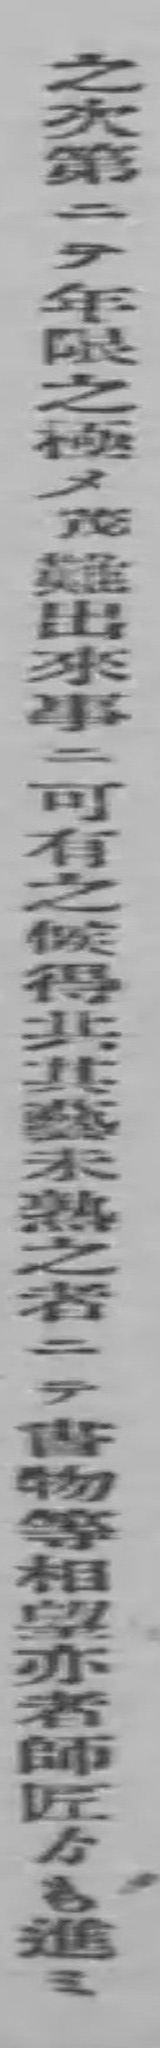之次第ニテ年限之極メ茂難出来事ニ可有之候得共其芸未熟之者ニテ書物等相望亦者師匠ゟも進ミ
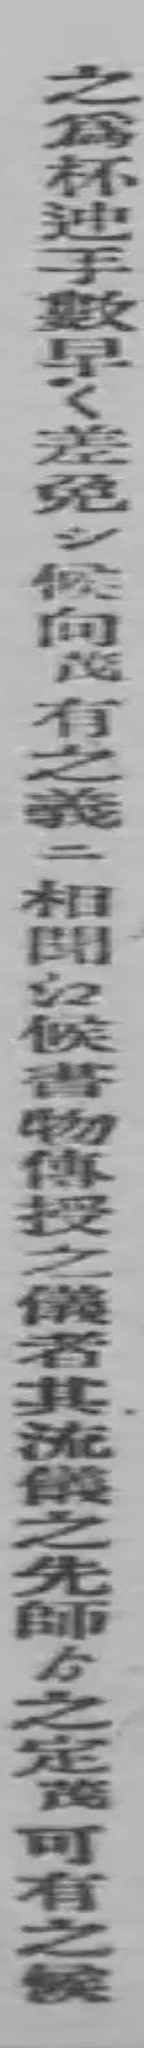之為抔迚手数早く差免シ候向茂有之義ニ相聞え候書物伝授之儀者其流儀之先師ゟ之定茂可有之候
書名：豊橋市史談
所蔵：国立国会図書館 National Diet Library, JAPAN
